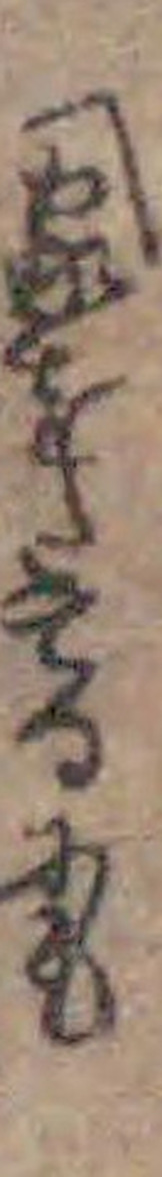〽家をたてるにも
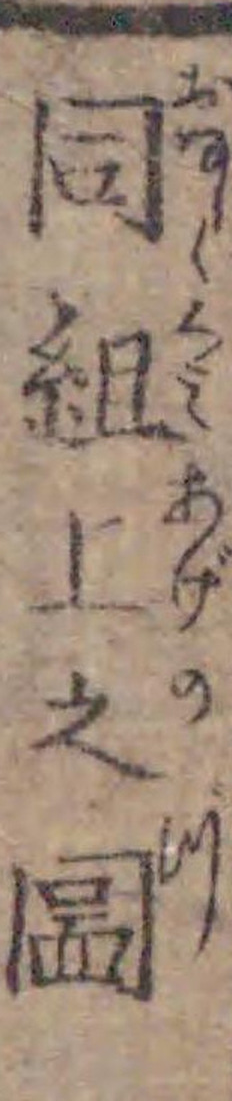同組上之図
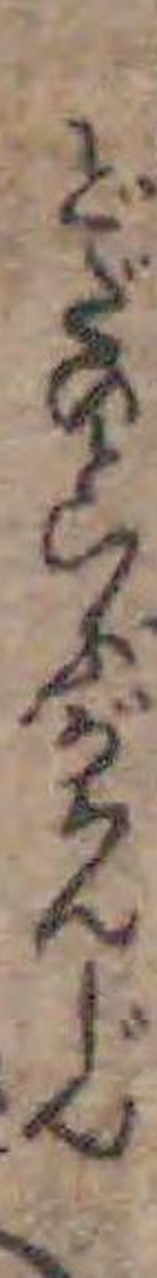どだいといふがかんじん
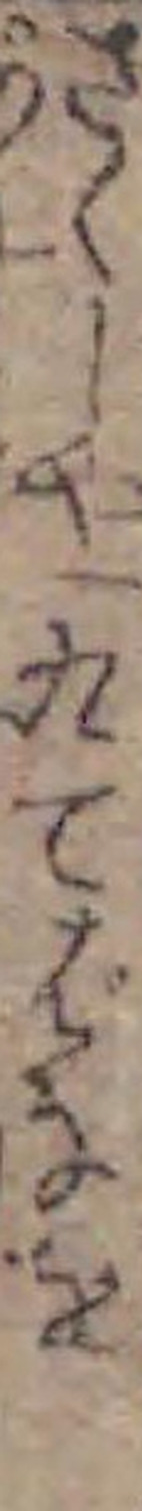さくしや一九てばなを
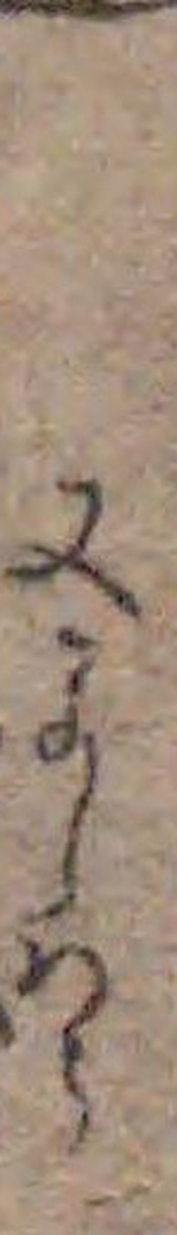又よしはら
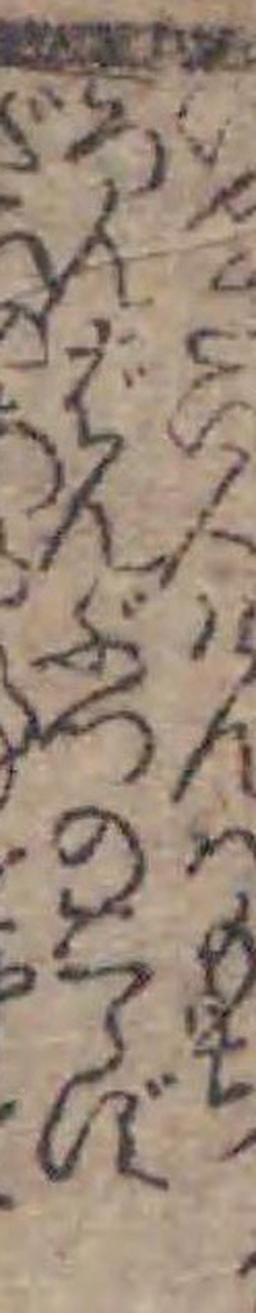ろんばんぶつのこらず
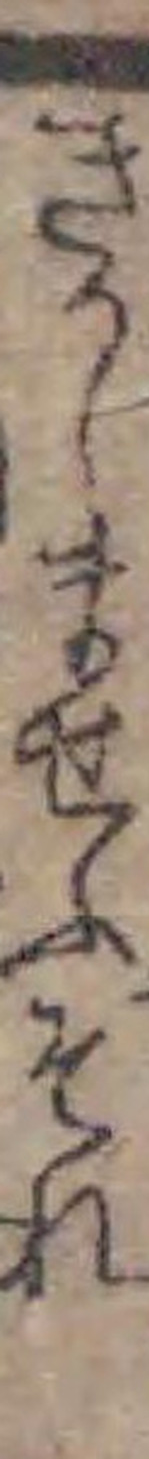きかしませふそれ
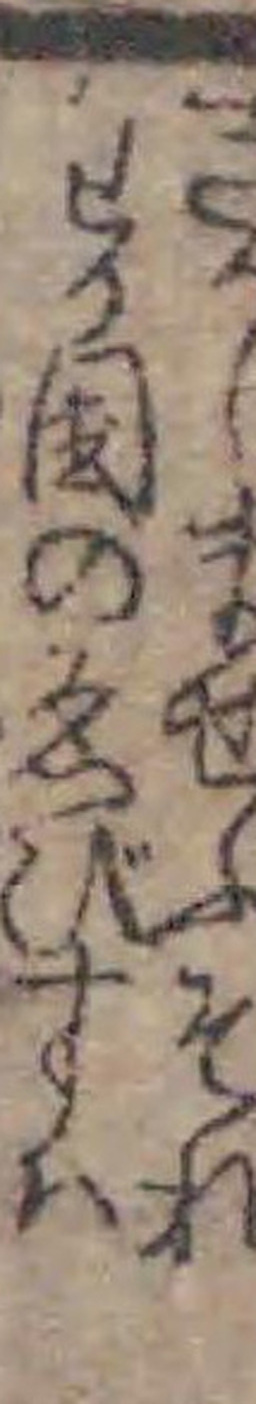わか国のゑびすは
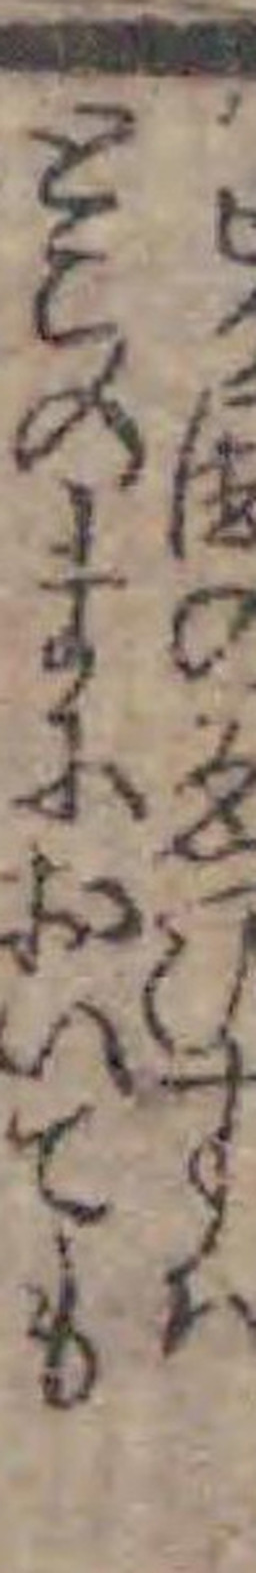とこのまにおいても
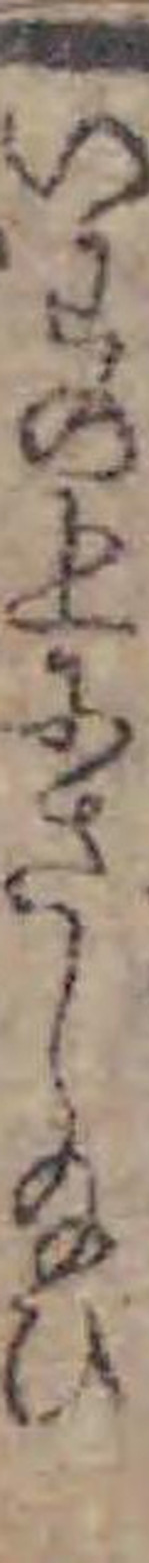いわの上にさし給ひ
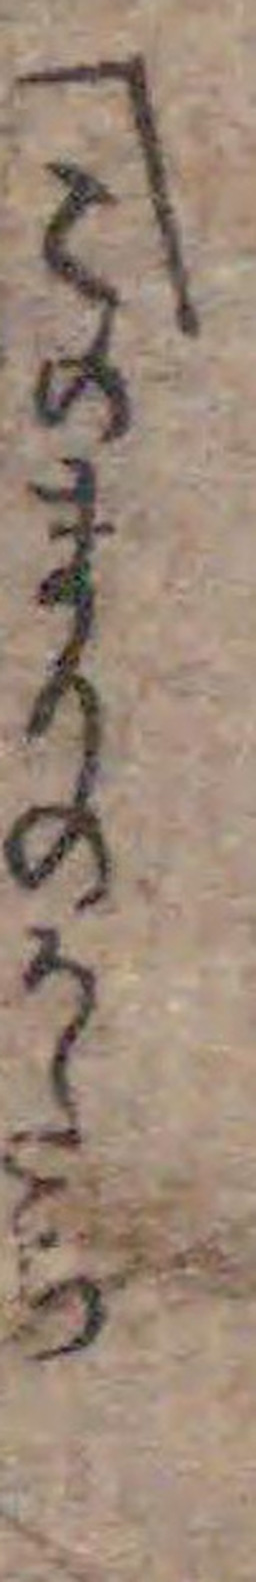〽このまりのかたち
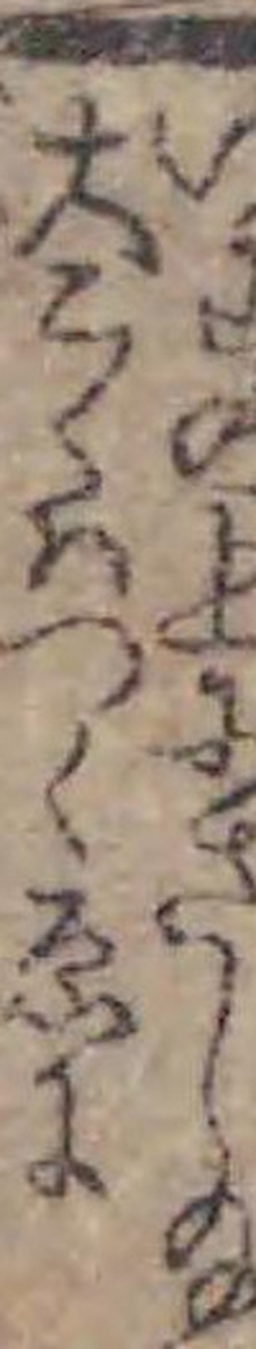大こくはつくゑに
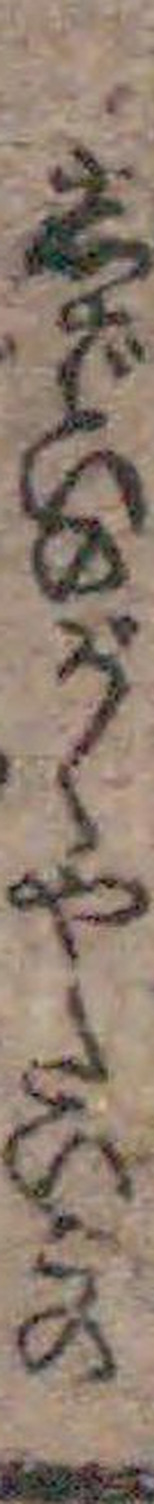しばいのがくやたいこの
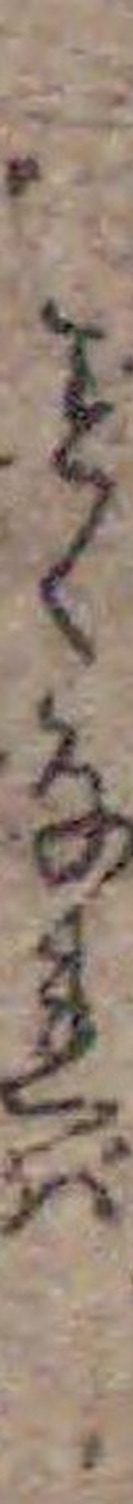ごとくなれば
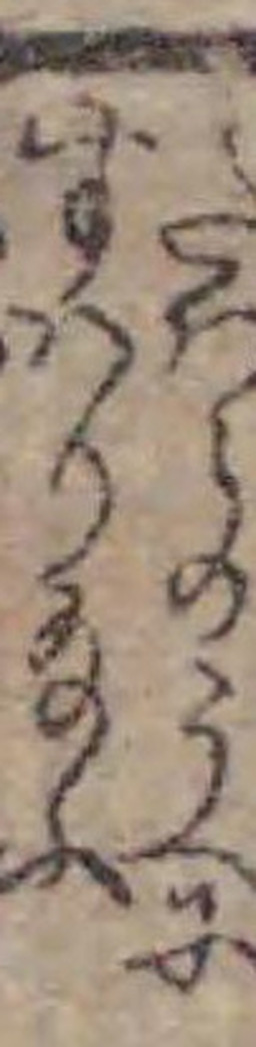すはり給ふ
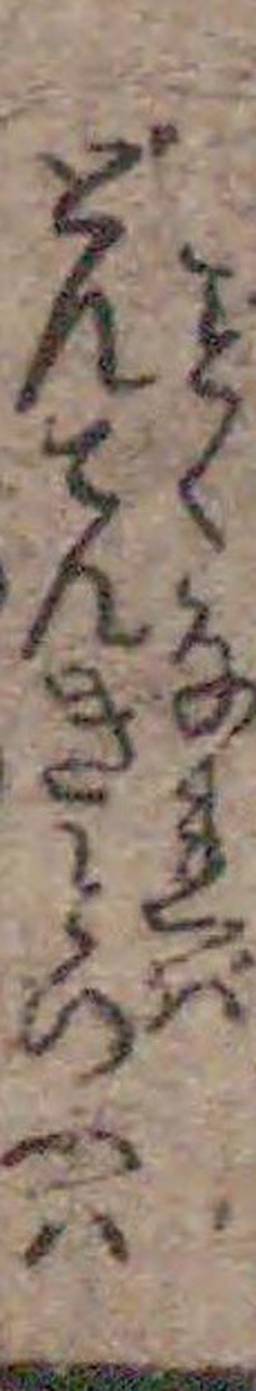どんてんきといふは
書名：奇妙頂礼胎錫杖 : 3巻
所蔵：国立国会図書館 National Diet Library, JAPAN
